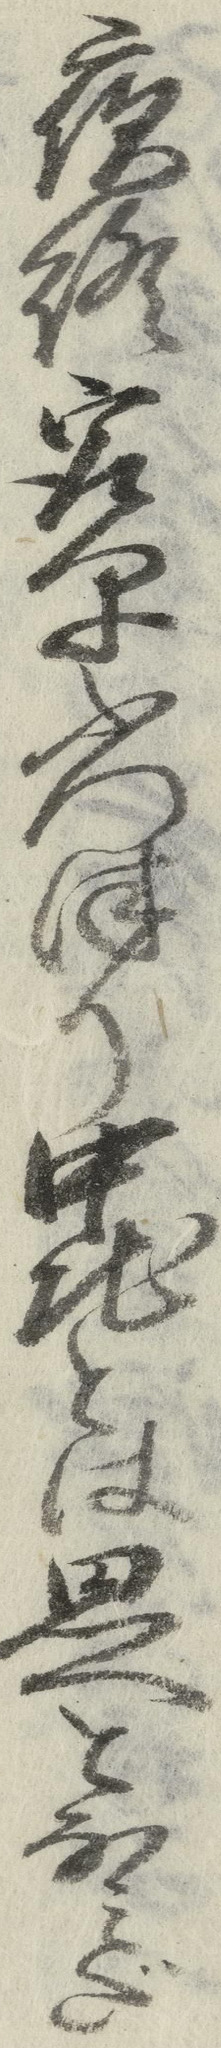夜終最早ふつつり中地とは思へとなみだ
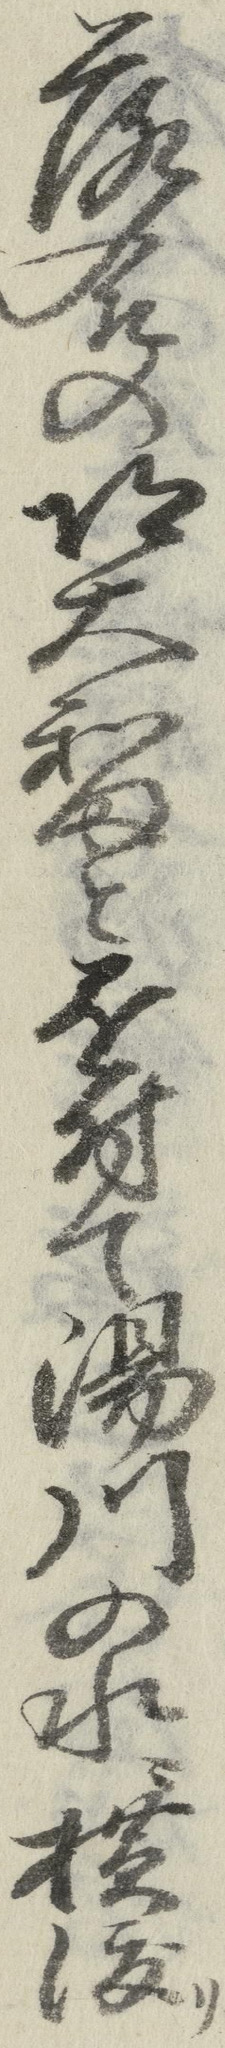落合の跡大和田と懸付て湯川の水に横渡
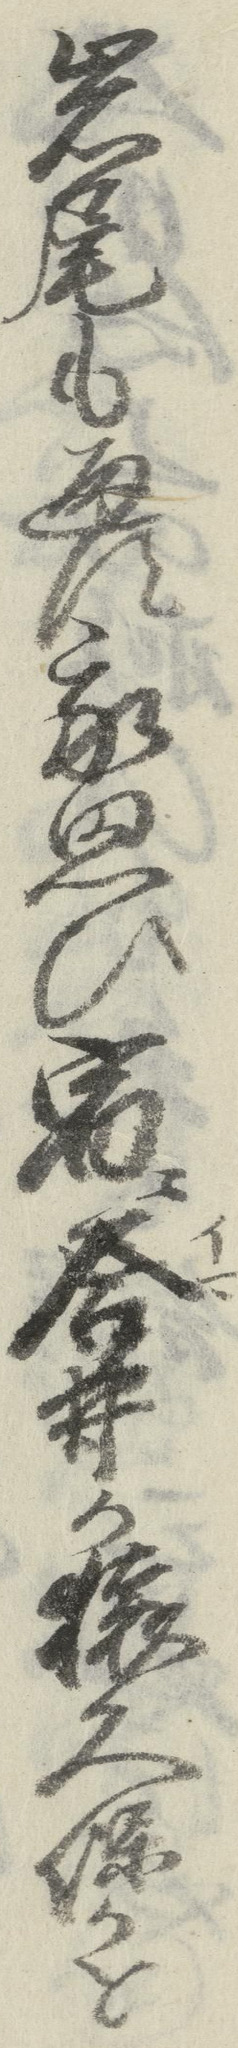岩尾も通す我思ひ宿に今井か猿久保かと
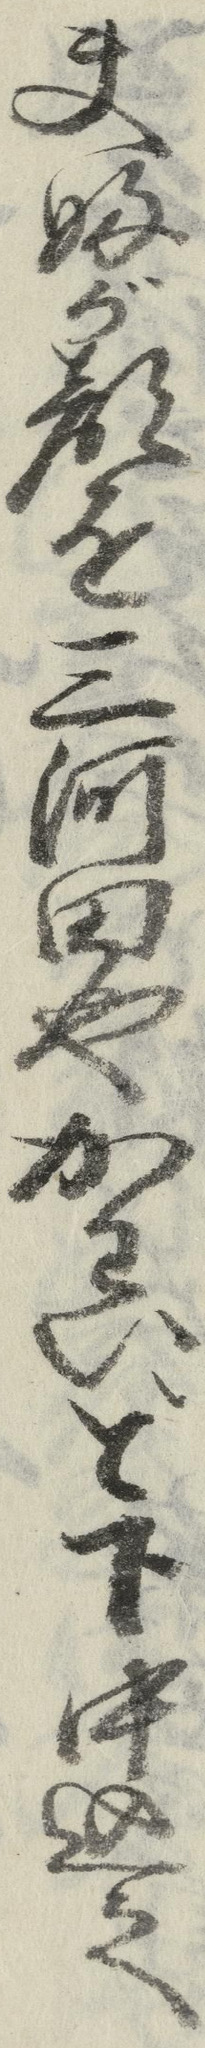夫婦が顔を三河田やかわいど下中込て
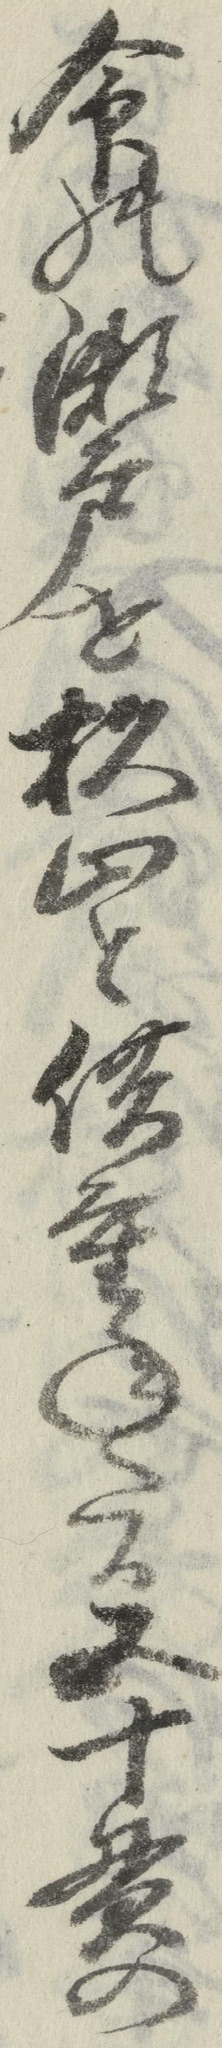命の瀬戸を杦山と借重ねたる五十貫の
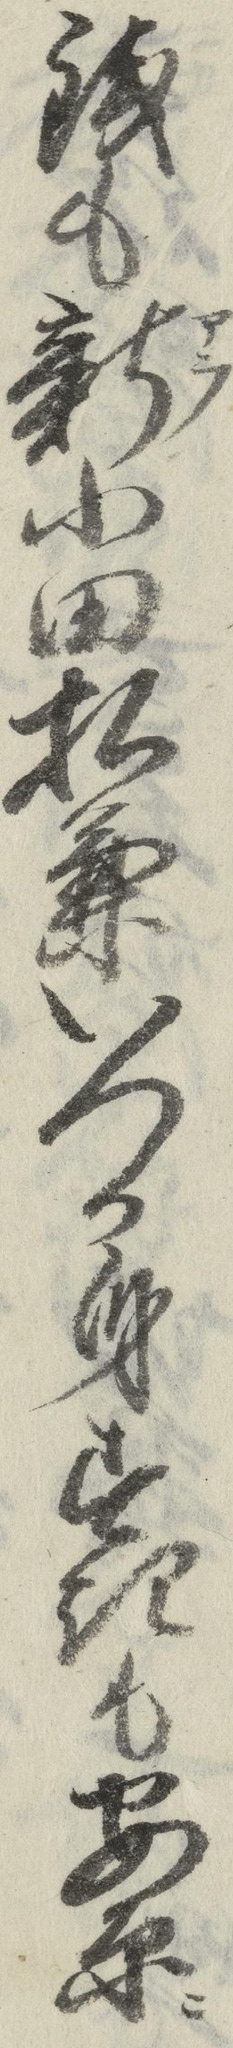銭も新小田松兼いつか身すきも安原に
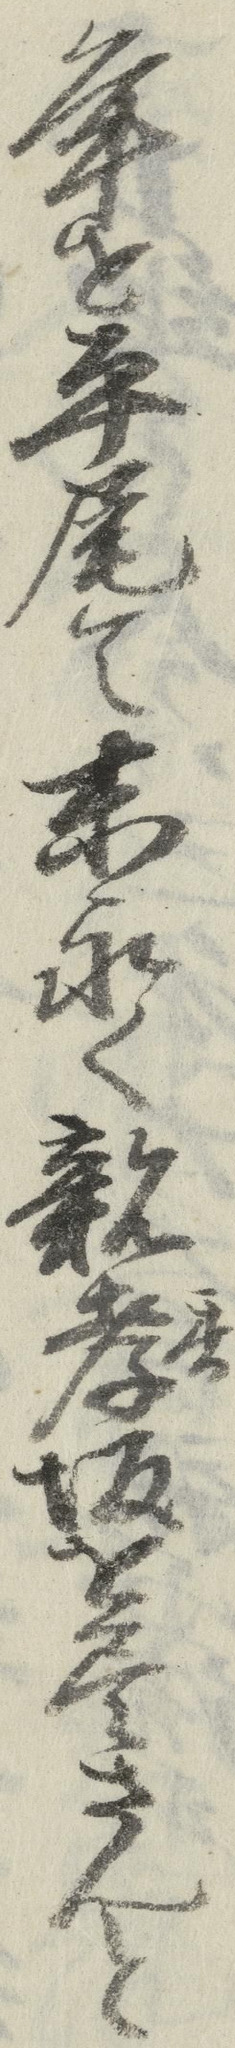年を平尾は末永く親孝坂を尽さんと
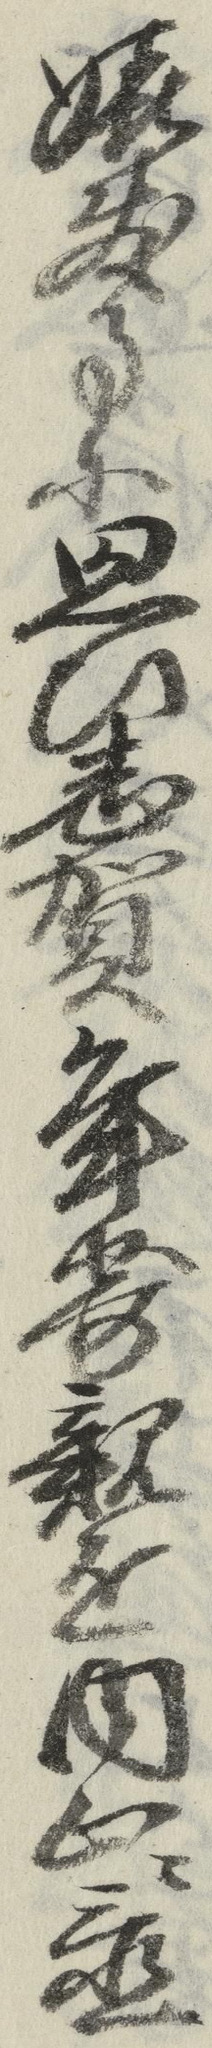嬉敷事に思ひ志賀年寄親を内山に置
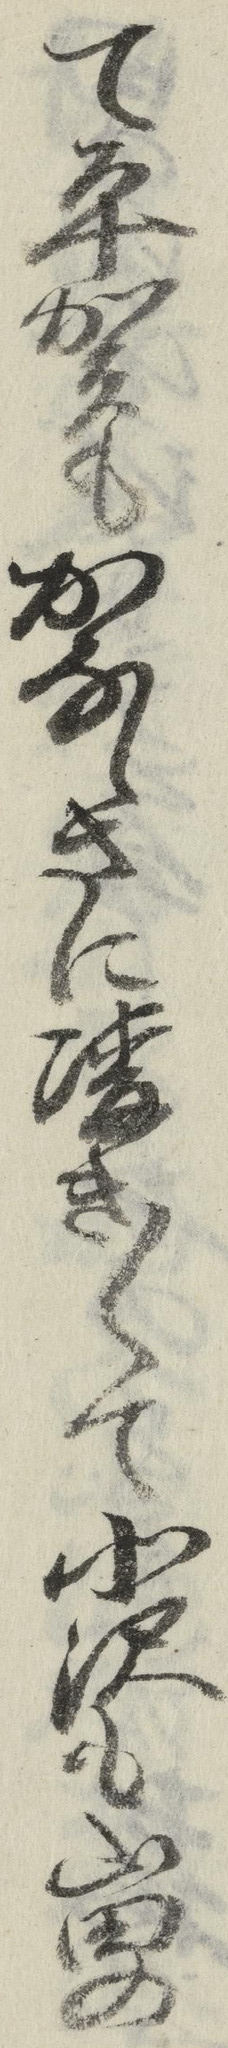て平賀もかなしさに凌き〳〵て小沢も山田の
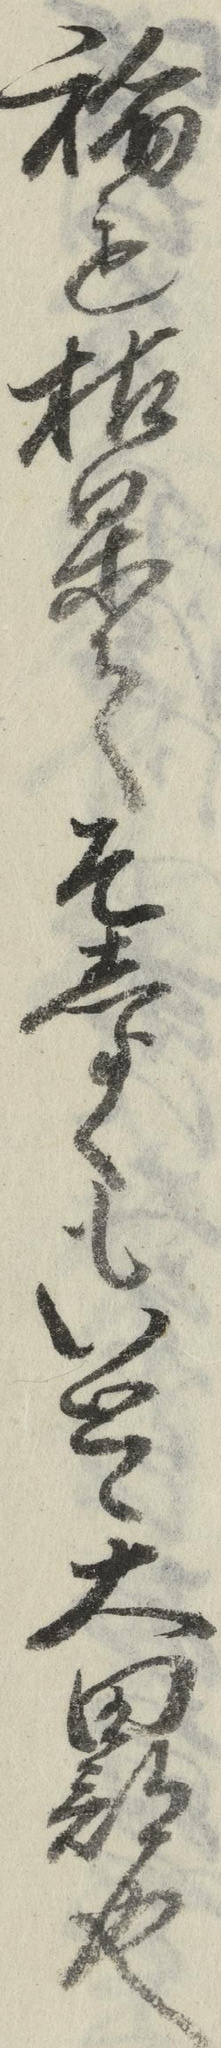稲も枯果てそしよくもいとゝ大田部や

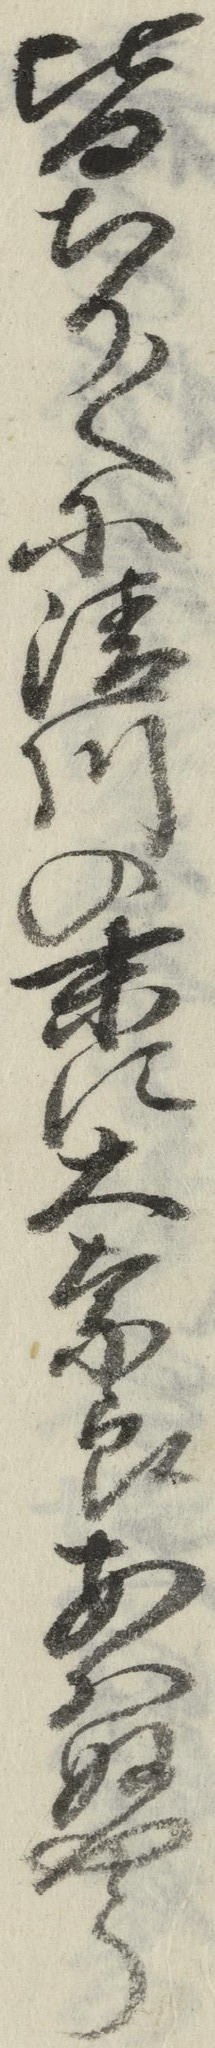皆ちり〳〵に清川の末に大奈良あはぬやう
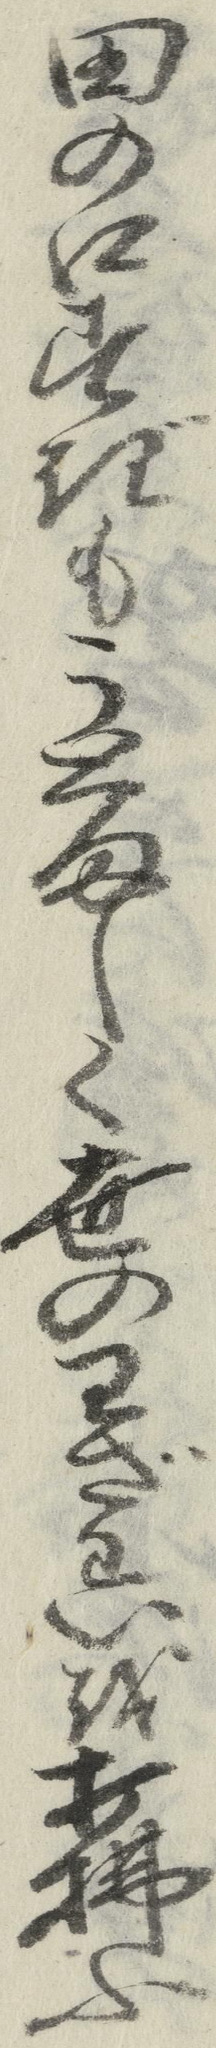田の口すぎもうとましく世のわざわいを打払ふ
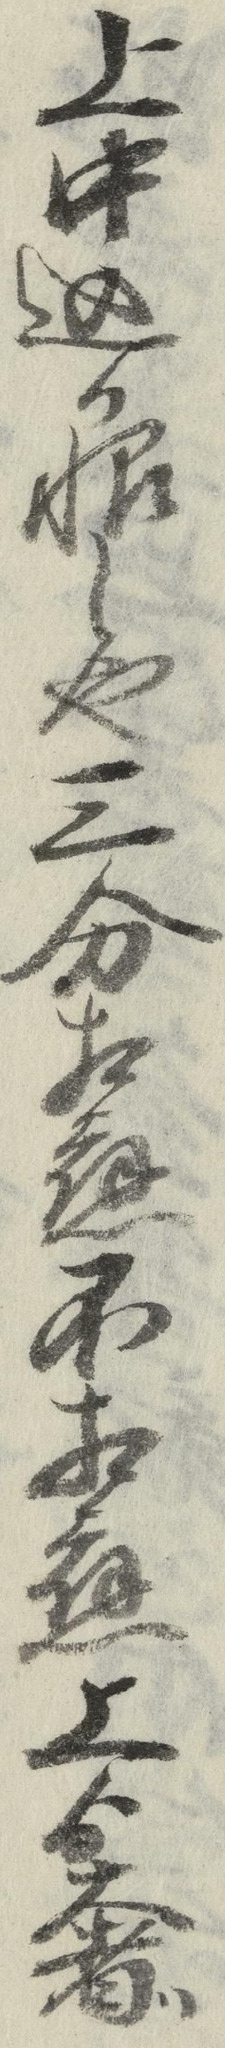上中込か恨しや三分相応不相応上ゟ奢
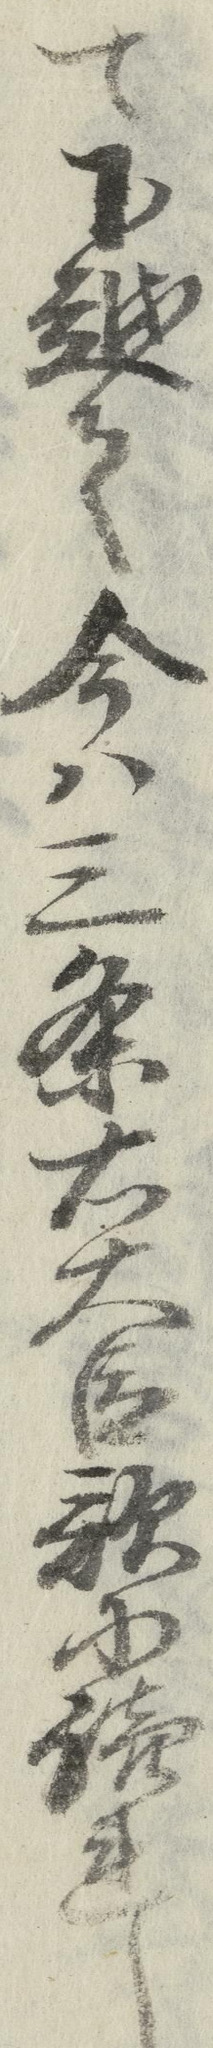て下越て今は三条右大臣歌に読れし
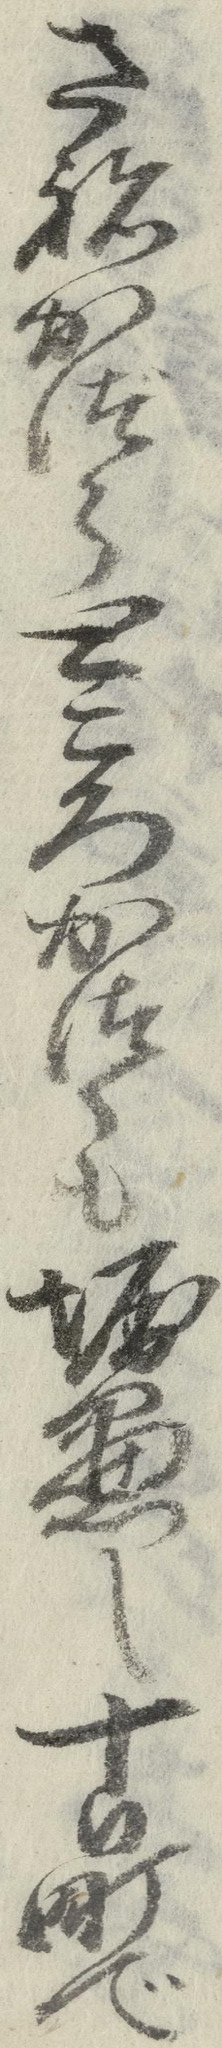さねかづらところかつらも堀画し十日町で
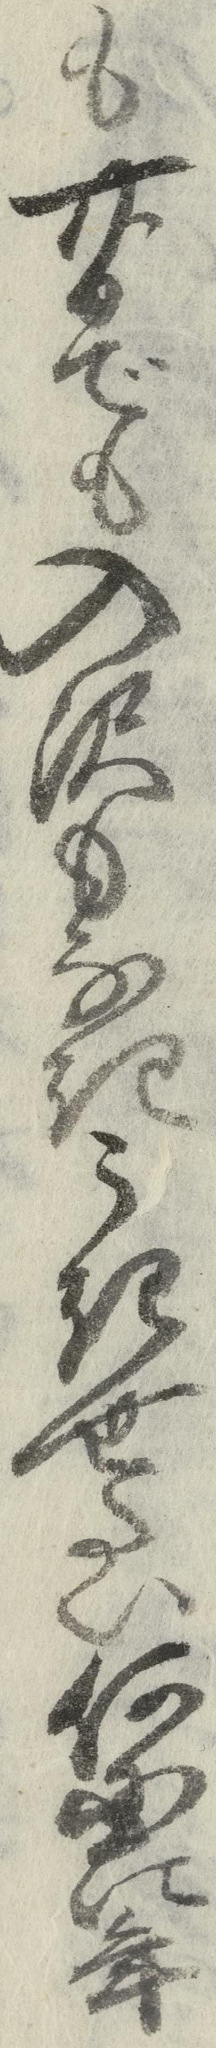も廿日でも入沢もなきうき世たひ何国に年
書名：浅間大焼騒動記　中
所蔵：東京大学地震研究所図書室 Earthquake Research Institute Library, The University of Tokyo, JAPAN
